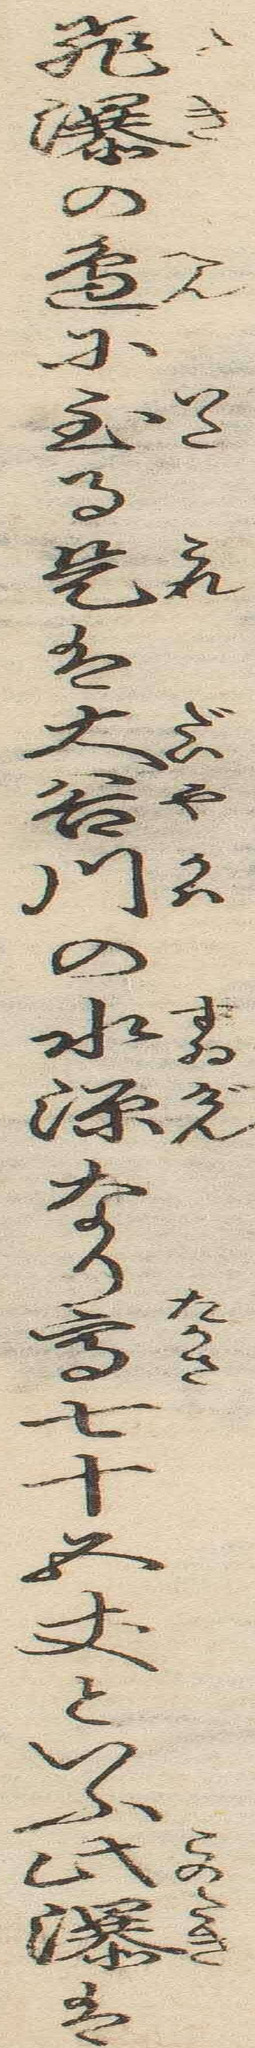飛瀑の邊に至る是は大谷川の水源なり高七十五丈といふ此瀑は
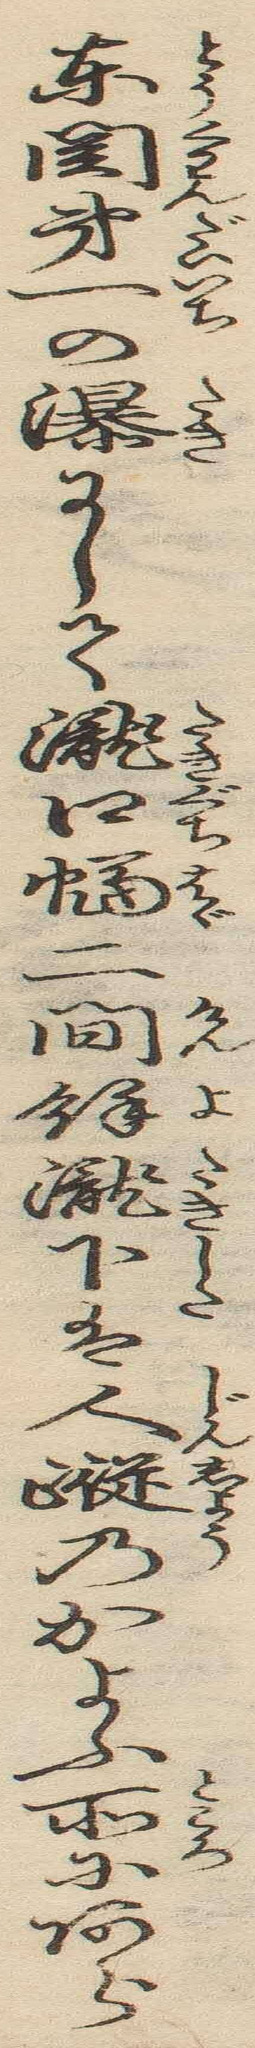東関㐧一の瀑にして瀧口幅二間餘瀧下は人蹤のかよふ所にあら

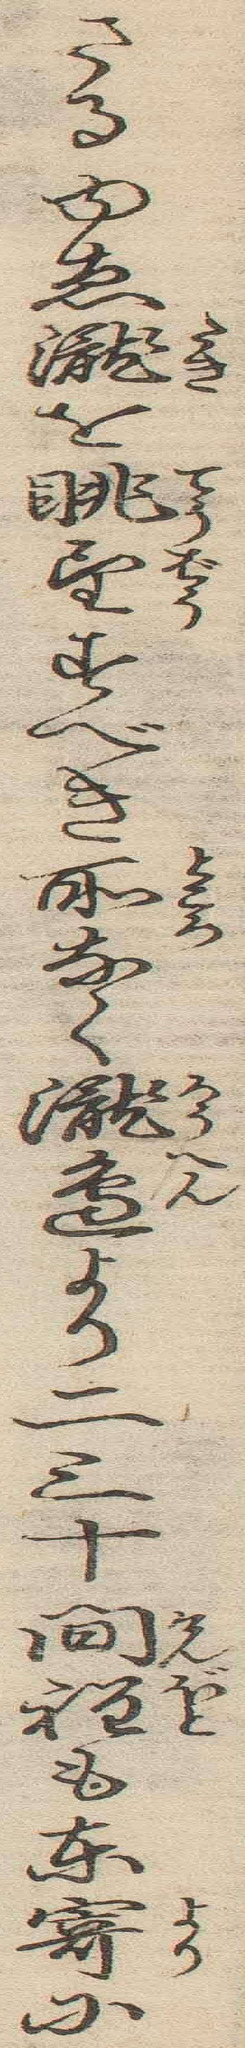さるゆゑ瀧を眺望すべき所なく瀧邊より二三十間程も東寄に
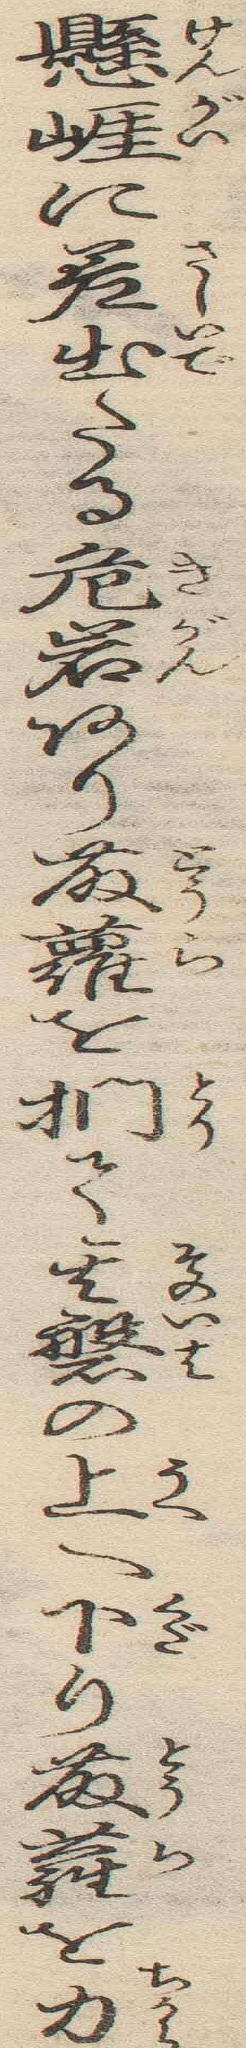懸崕に差出たる危岩あり藤蘿を捫て其磐の上へ下り藤蘿を力
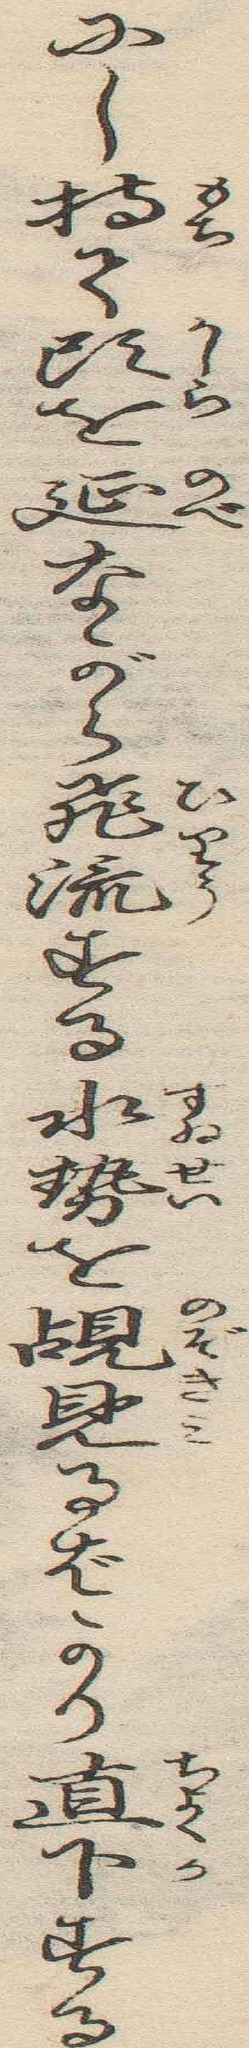にし持て頭を延ながら飛流する水㔟を覘見るばかり直下する
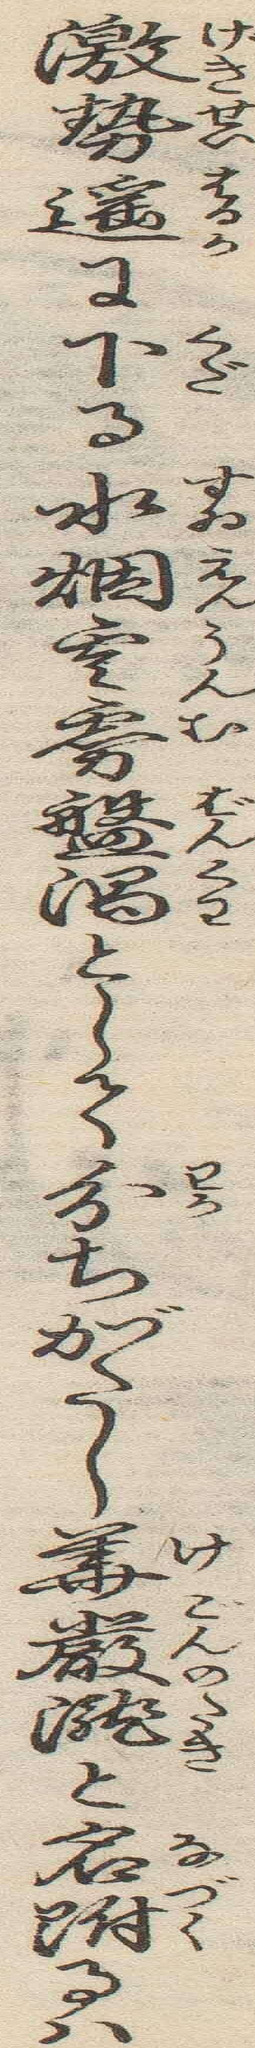激㔟遥に下る水烟雲霧盤渦として分ちがたし華嚴瀧と名附るは
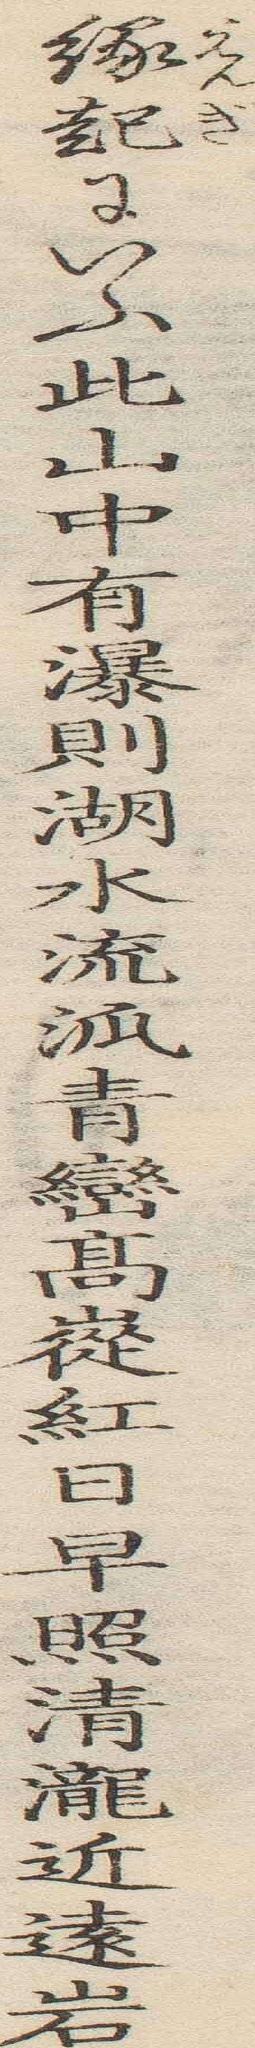縁起にいふ此山中有瀑則湖水流泒青巒髙嵸紅日早照清瀧近遠岩
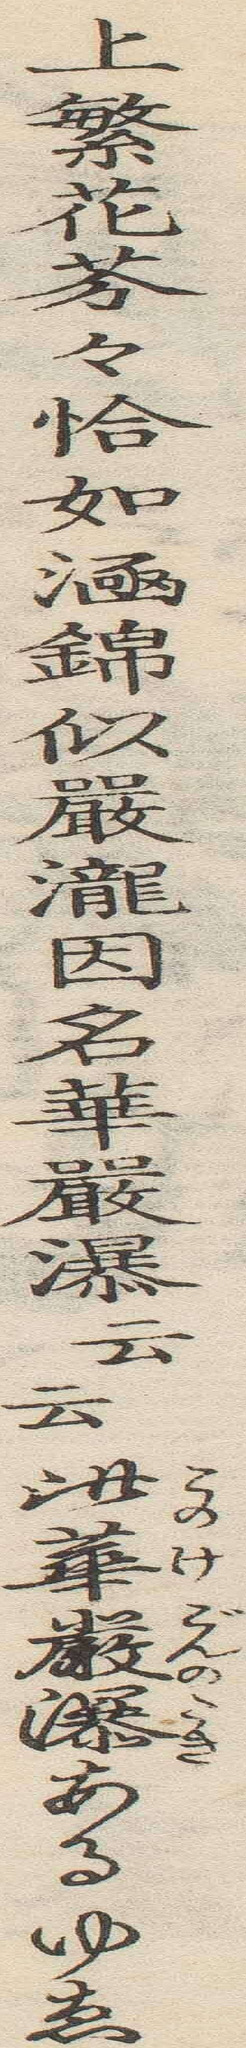上繁花芬々恰如㴠錦似嚴瀧因名華嚴瀑云云此蕐嚴瀑あるゆゑ
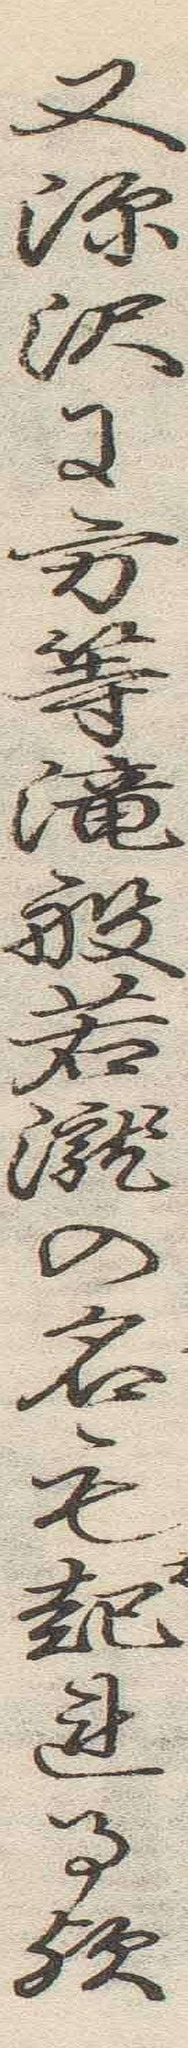又深沢に方等瀧般若瀧の名も起れる欤
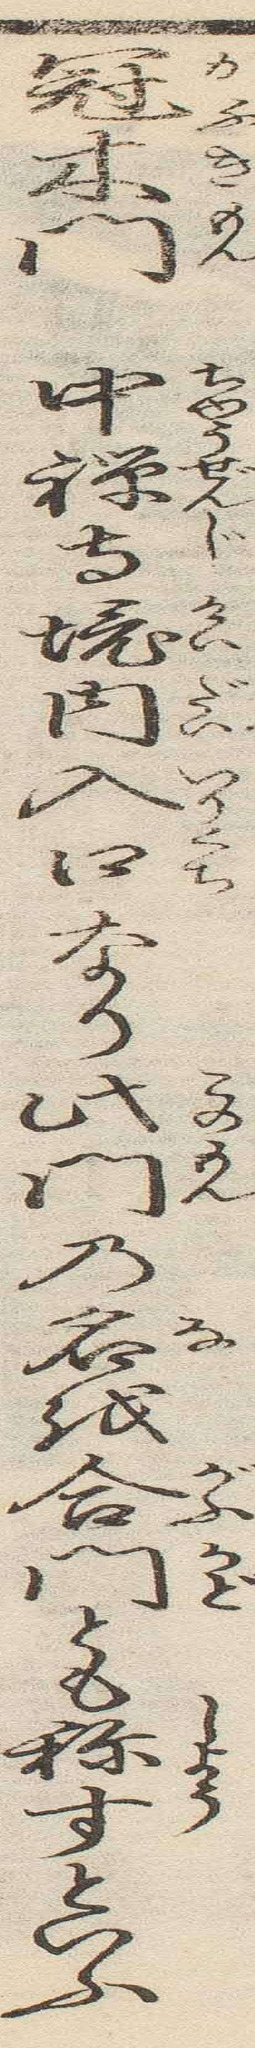冠木門中禅寺境内入口なり此門の名を合門とも称すといふ
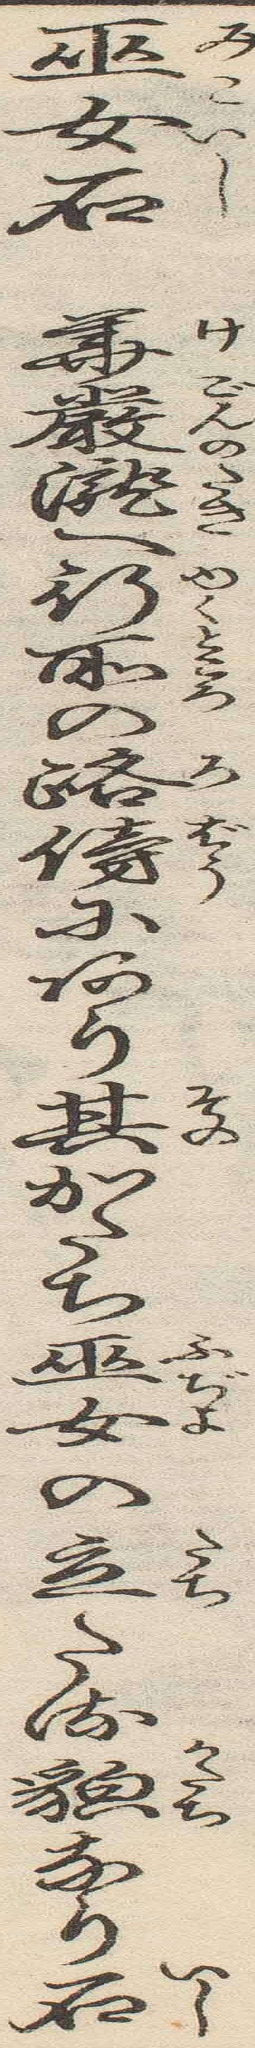巫女石華嚴瀧へ行所の路傍にあり其かたち巫女の立たる貌なり石
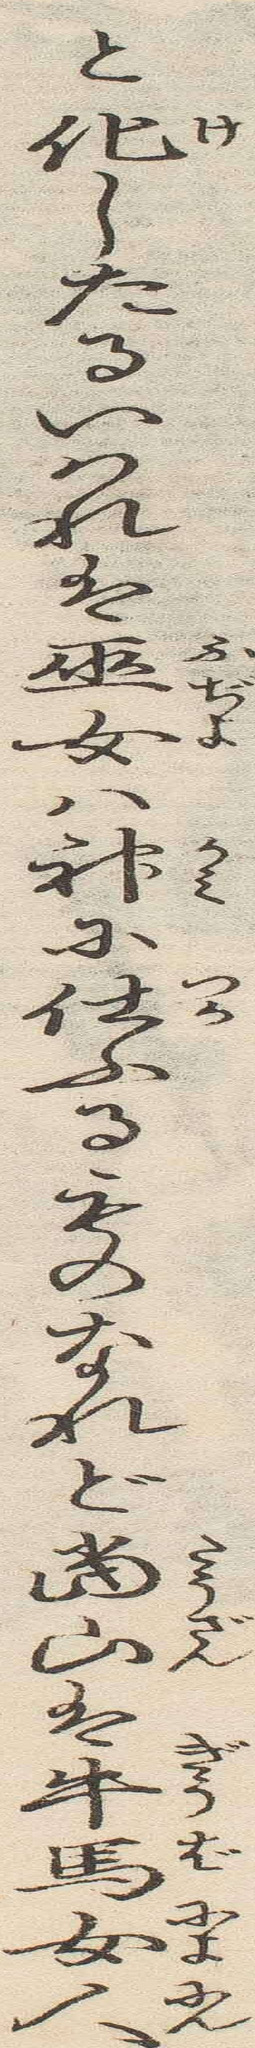と化したるいはれは巫女は神に仕ふるものなれど當山は牛馬女人
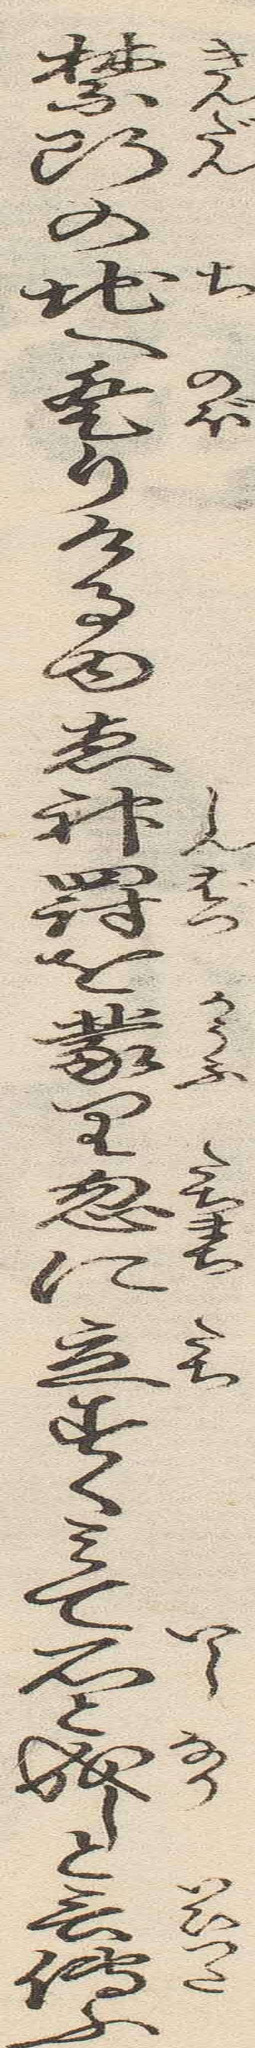禁断の地へ登りけるゆゑ神罸を蒙り忽に立すくみて石と成しと云傳ふ
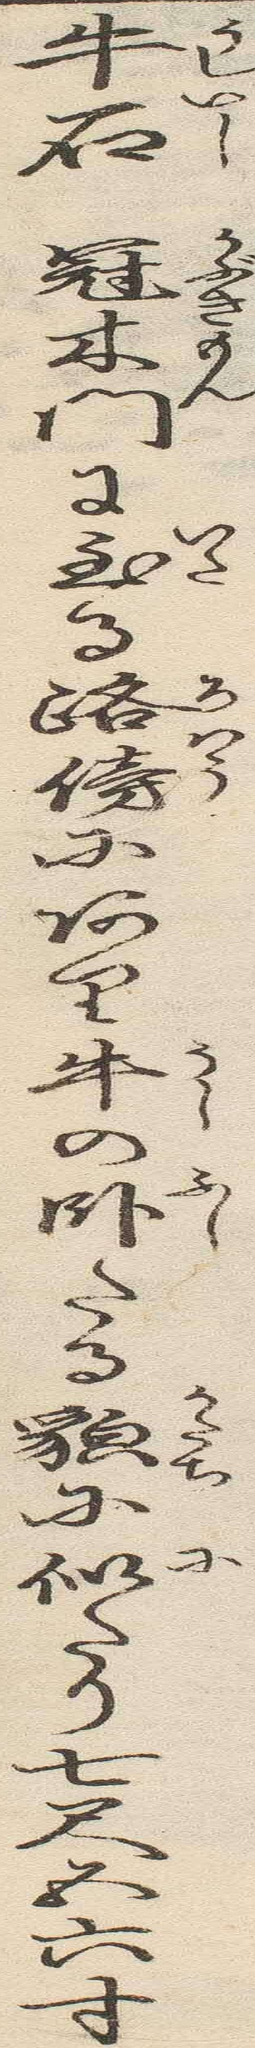牛石冠木門に至る路傍にあり牛の卧たる貌に似たり七尺五六寸
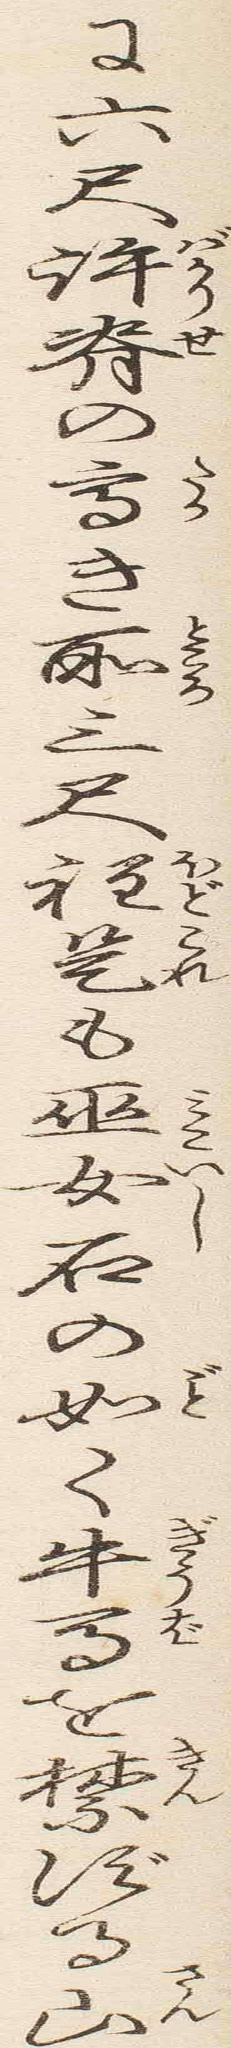に六尺許脊の高き所三尺程是も巫女石の如く牛馬を禁ずる山
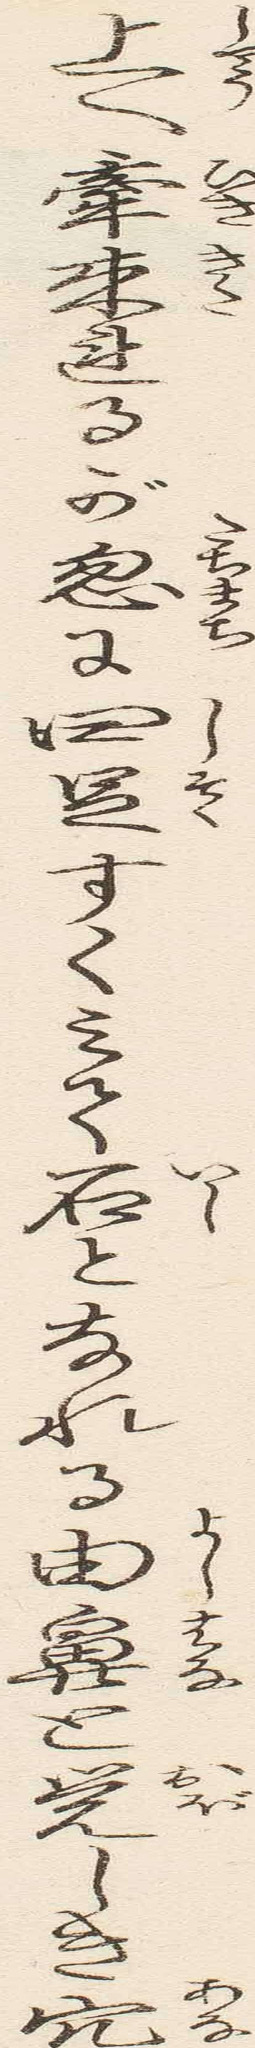上へ牽來れるが忽に四足すくみて石となれる由鼻と覚しき穴
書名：日光山志
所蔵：東京学芸大学附属図書館 国文学研究資料館
